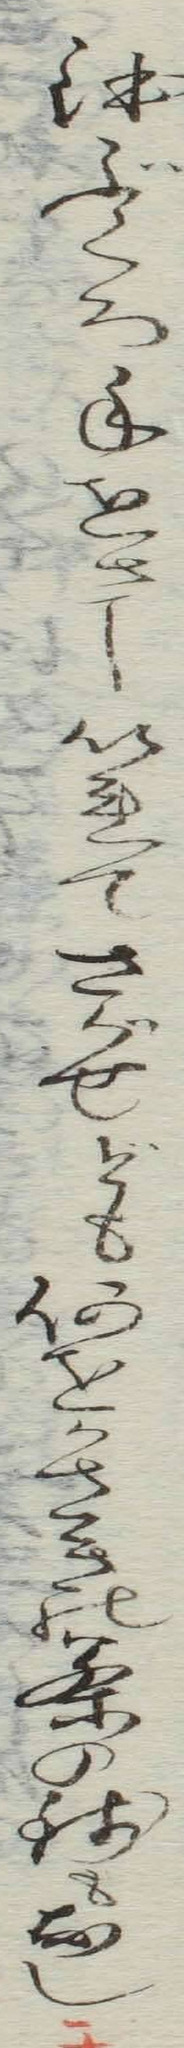鉢ぶくろ手をさしいれてさがせども何をかさきの茶の銭もなしモ
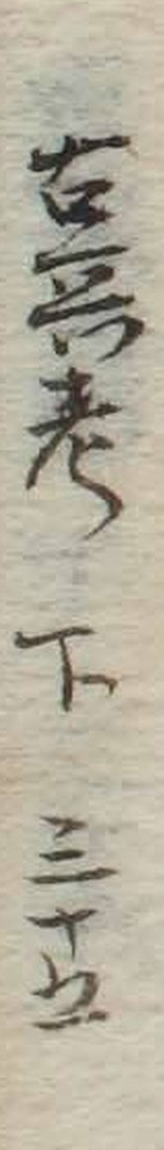古歌考下三十五

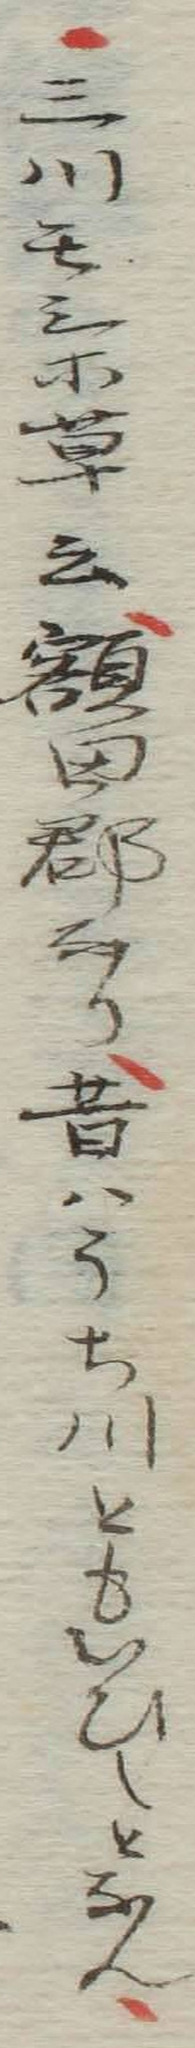○藤川●三川モシホ草云、額田郡なり、昔はうち川ともいひしとなん、
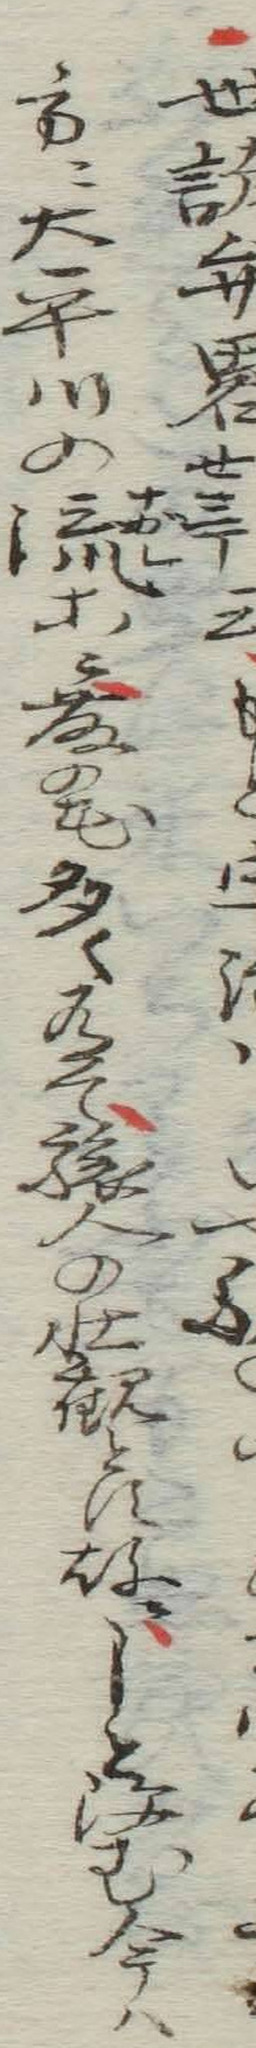方ニ大平川の流等ニ、藤の花多く有て、旅人の壮観とす故ニ之と改む今は
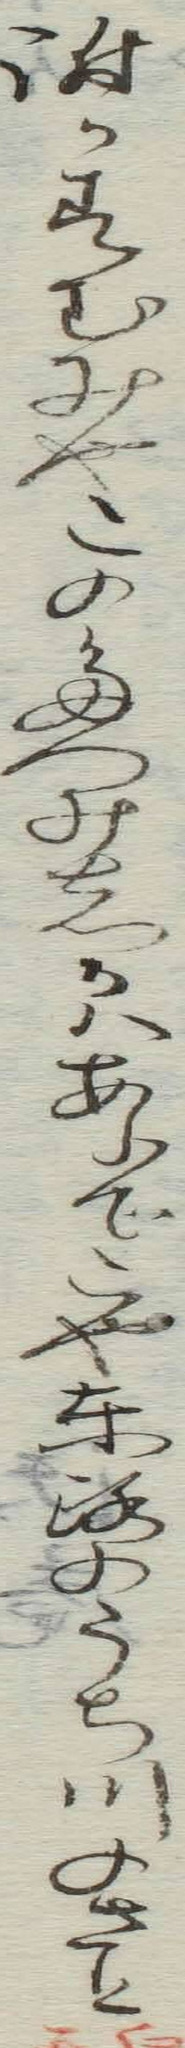誰かすむみやこのたつみしかはあらでこや東路のうち川のさと白モ
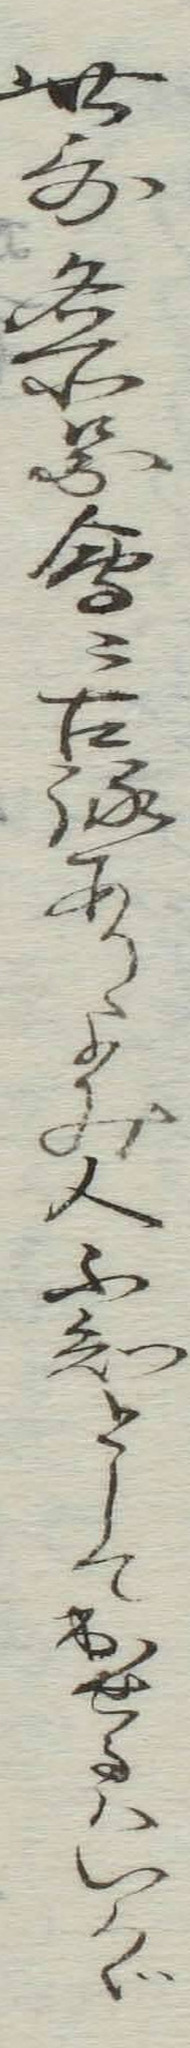此歌名所図会ニ古詠ありよみ人不知として出せるはいかゞ
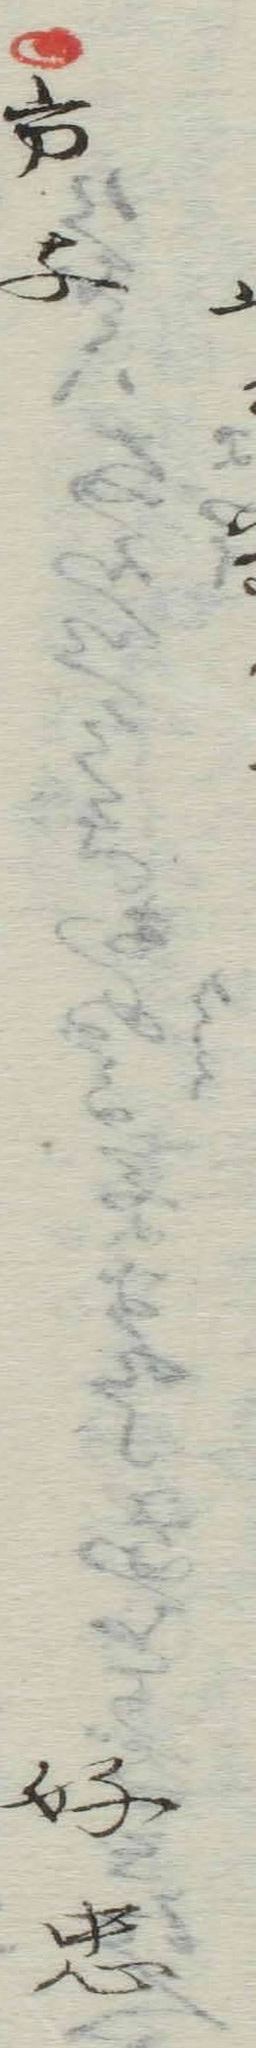●方与好忠
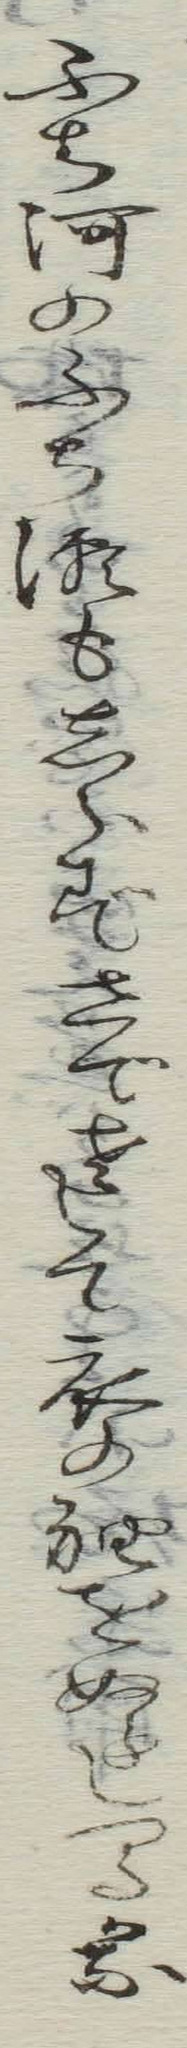ふち河のふち瀬もしらずさでさして衣の袖をぬらしつるかな
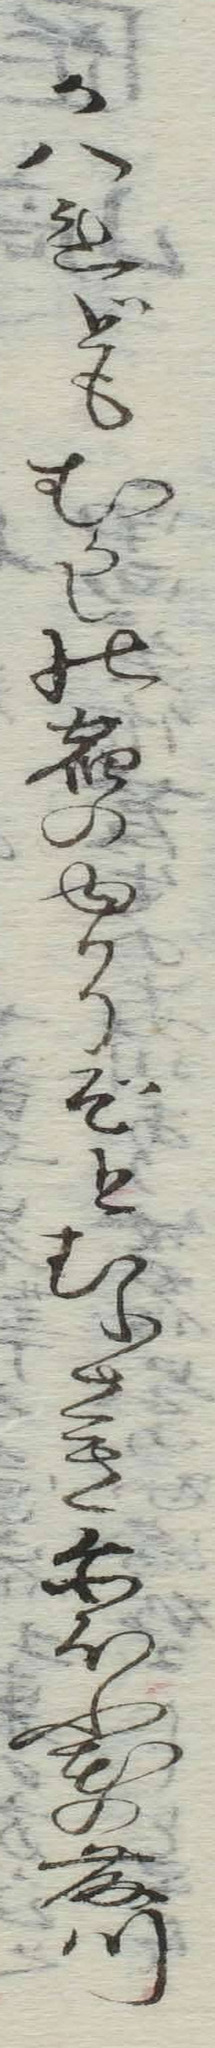かはれどもむかしの宿のゆかりぞとむらさきにほふ花の藤川
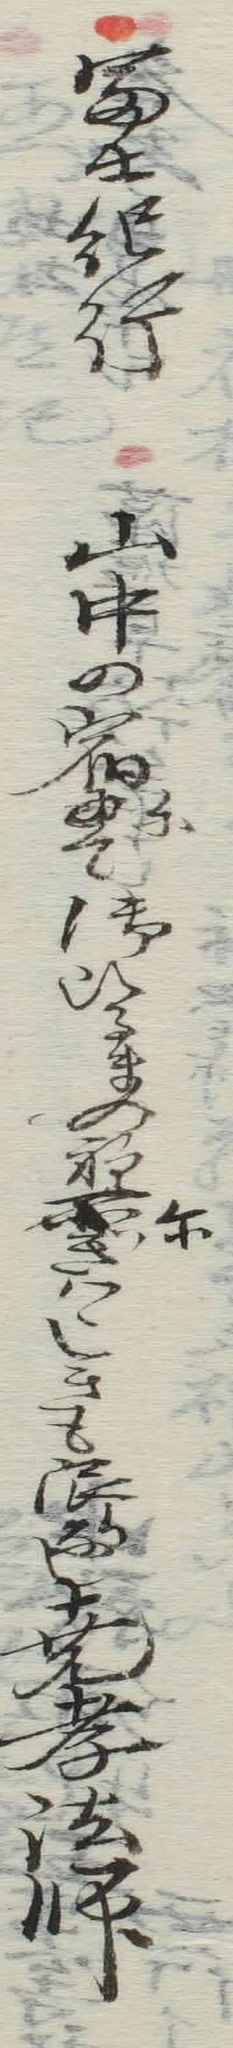●富士紀行山中の宿にて御ひるまの程にぎはゝしきも限りなし尭孝法師
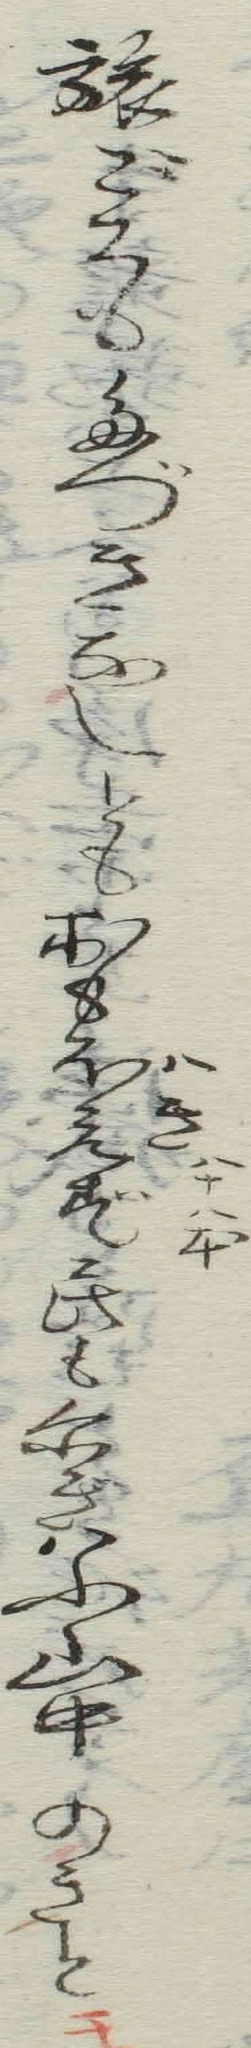旅ごろもたづきなしともおもほえず民もにぎはふ山中のきとモ
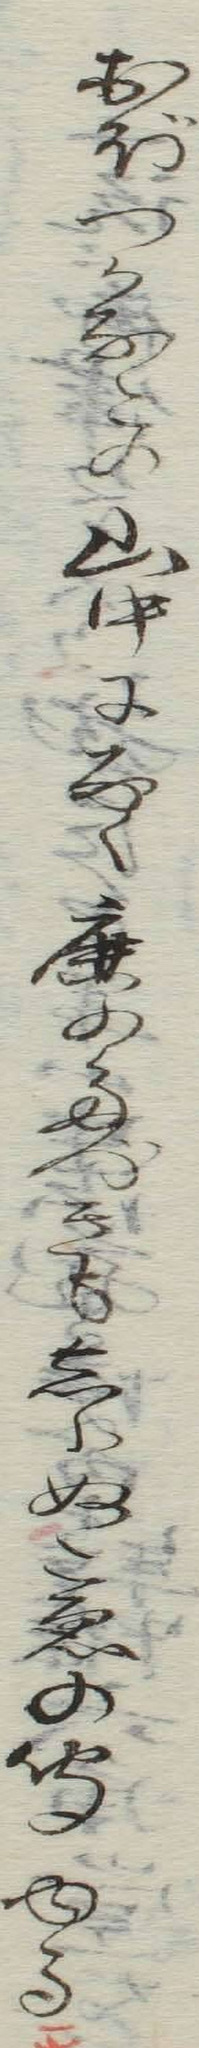おぼつかなこの山中になく鹿のたづきもしらぬこゑの聞ゆるモ
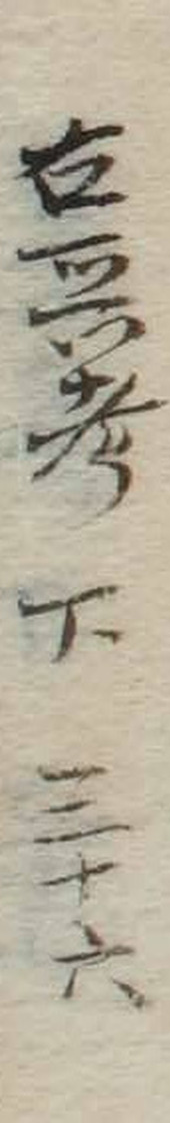古歌考下三十六

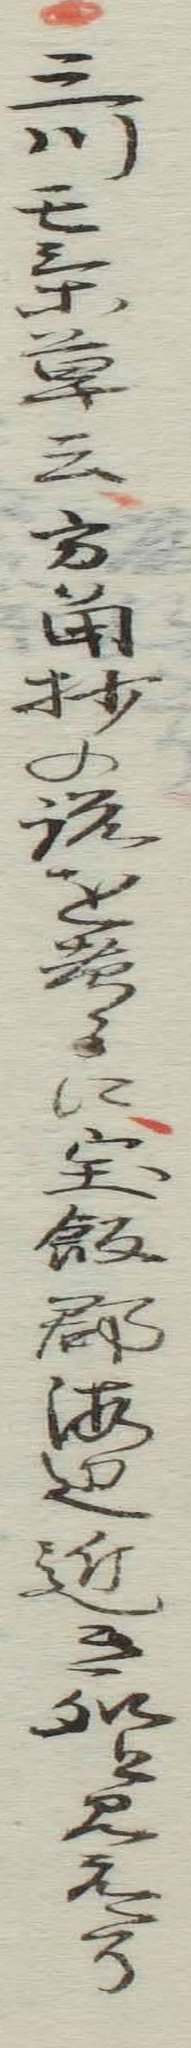●三川モシホ草云、方角抄の説を考るに、宝飯郡海辺近き処と見えたり
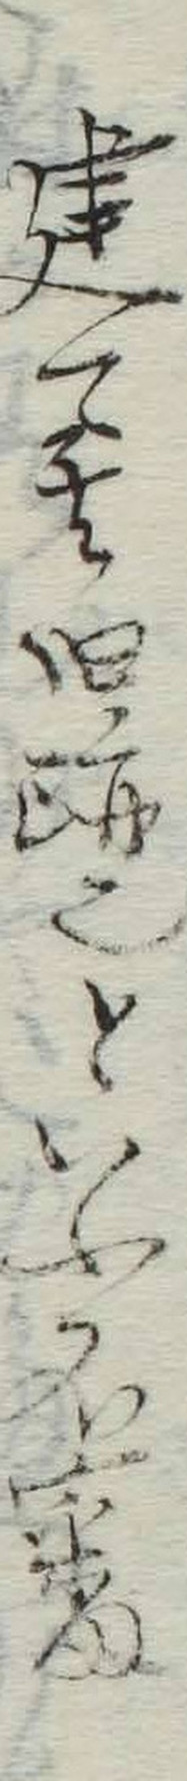建て其旧跡也といふ不審
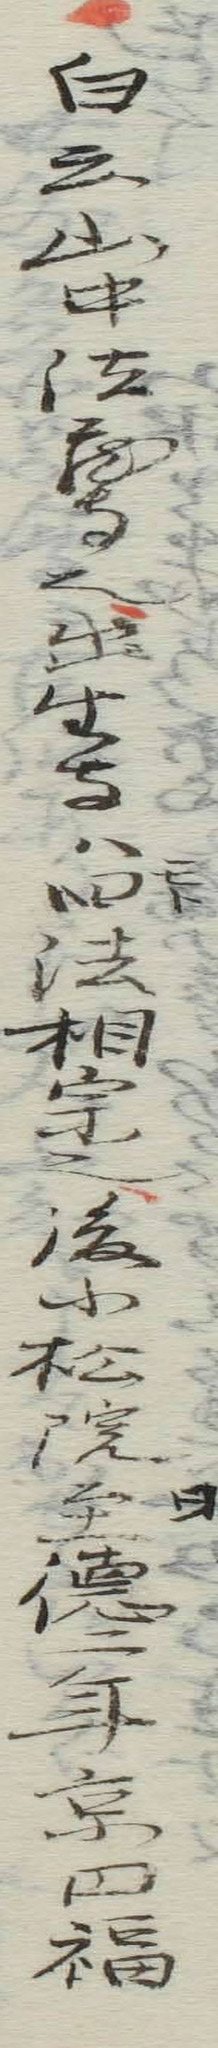●白云山中法蔵寺也、出生寺は旧法相宗也、後小松院至徳二年京円福
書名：三河国古跡考
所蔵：国文学研究資料館
